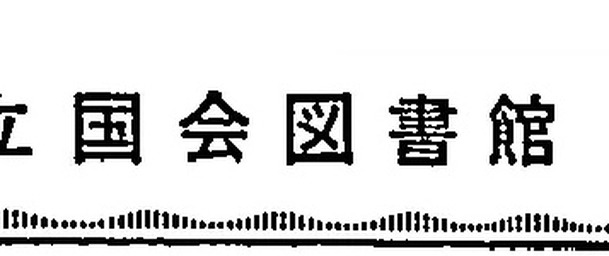国立国会図書館
